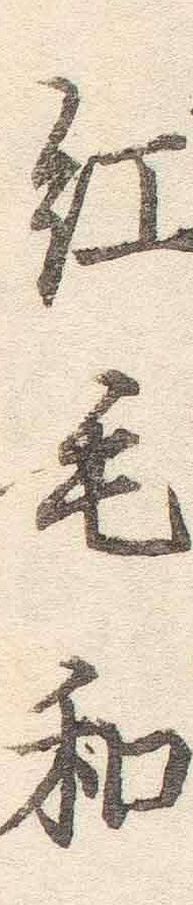紅毛和
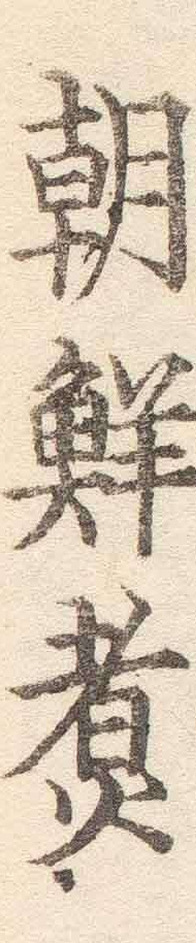朝鮮煮
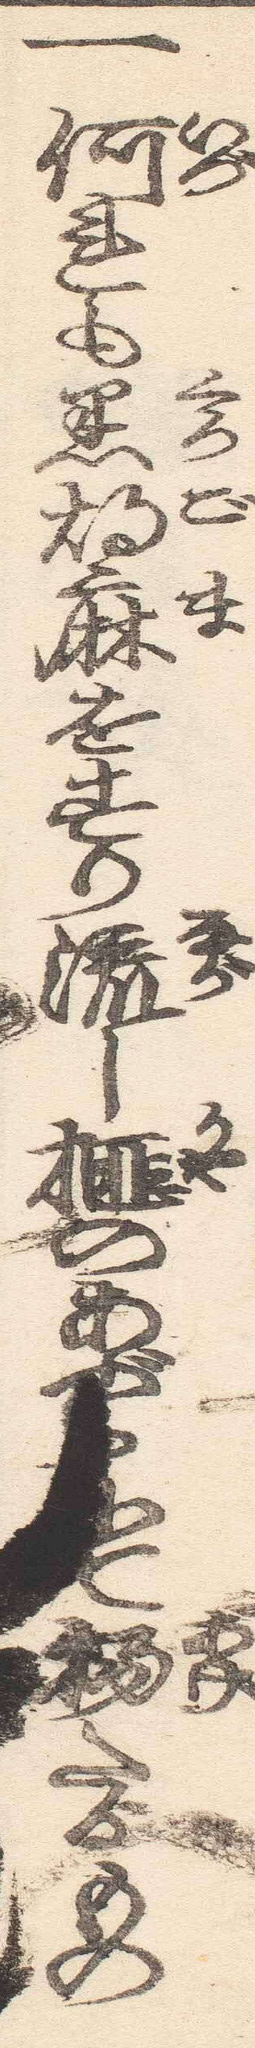一何れも黒胡麻をすり流し榧のあぶらにて揚たるもの
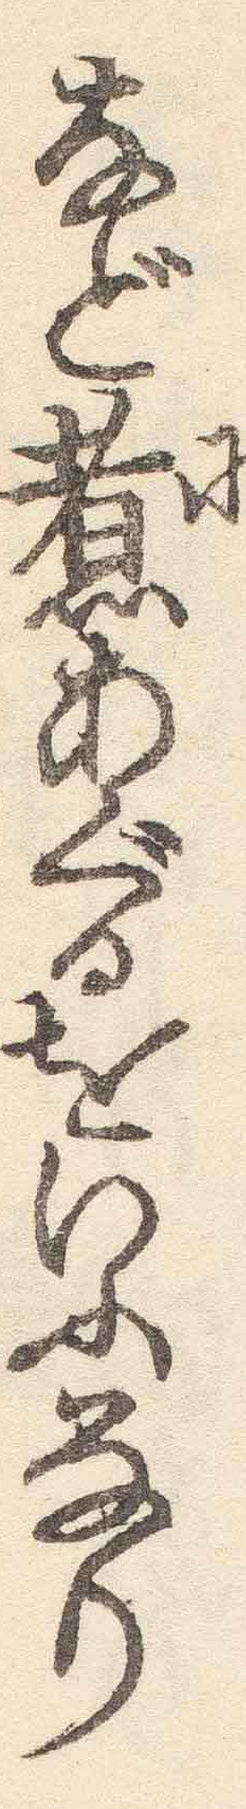など煮あぐるをいふなり
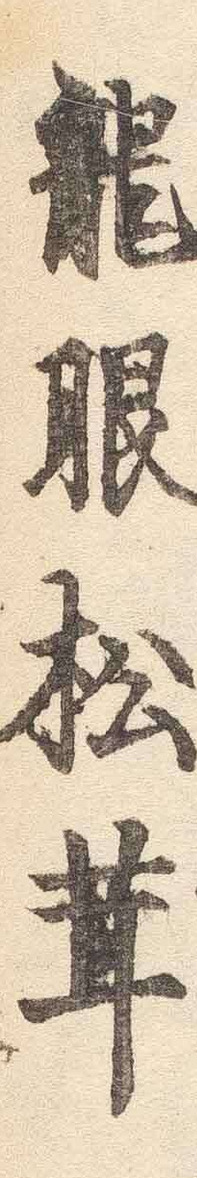龍眼松茸
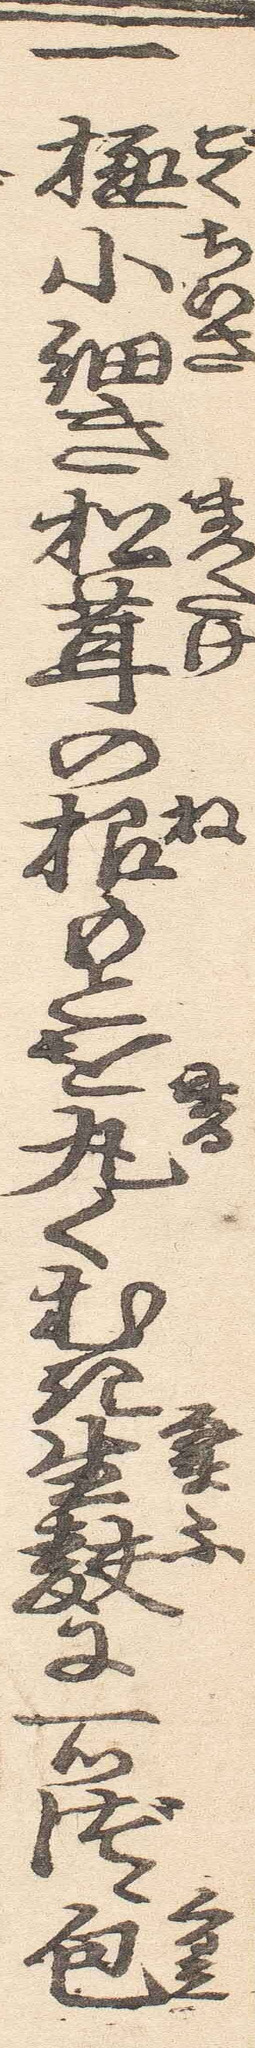一極小細き松茸の根もとを丸くむき生麩に一つづゝ包
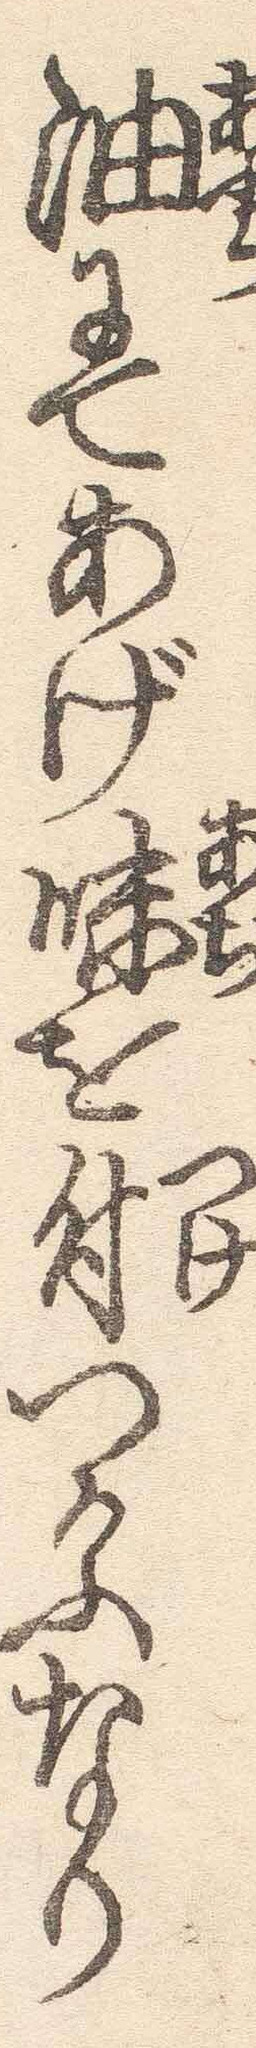油にてあげ味を付つかふなり
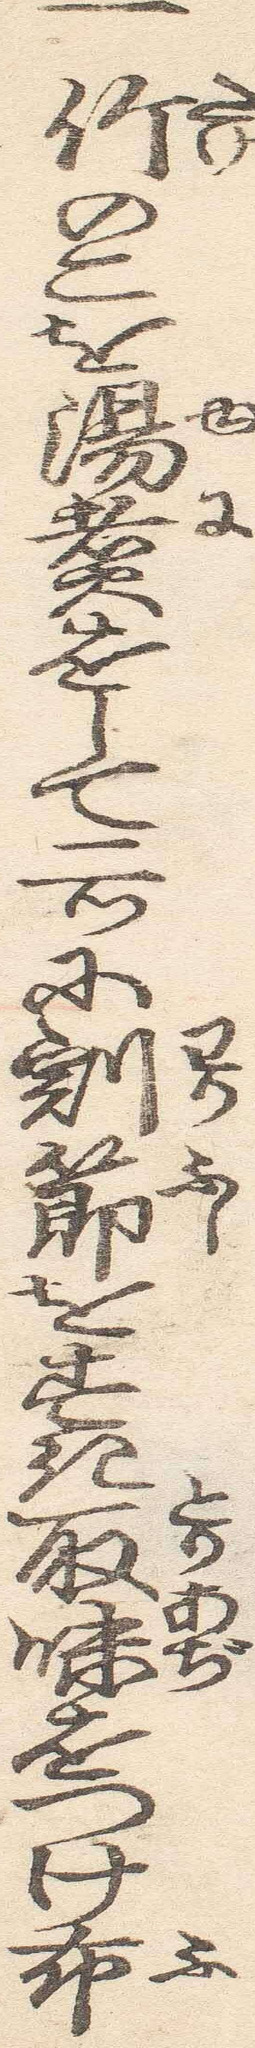一竹のこ湯煮をして二つに割節をすき取味をつけ布
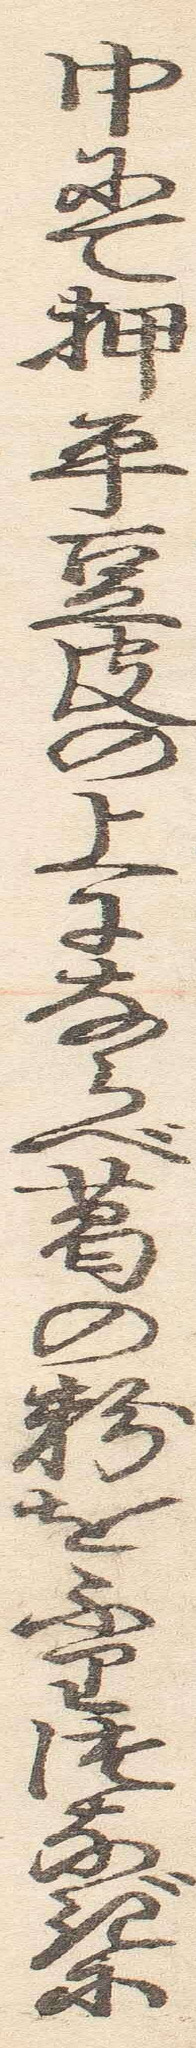巾にて押平豆皮の上にならべ葛の粉をふりつなぎに
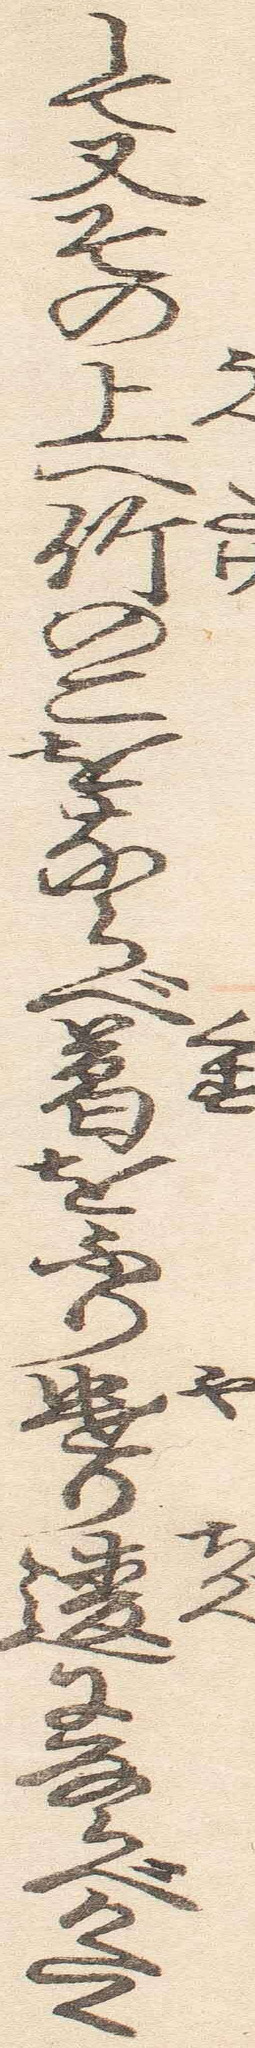して又その上へ竹のこをならべ葛をふり遣り違にならべかたく
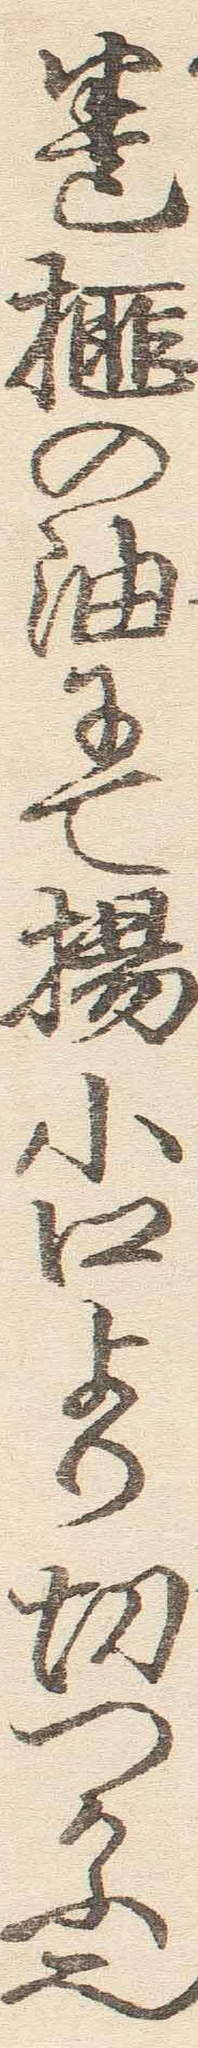巻榧の油にて揚小口より切つかふ也
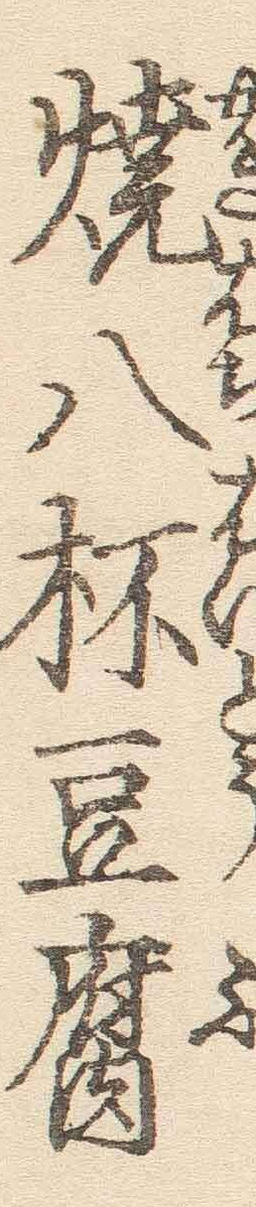焼八杯豆腐
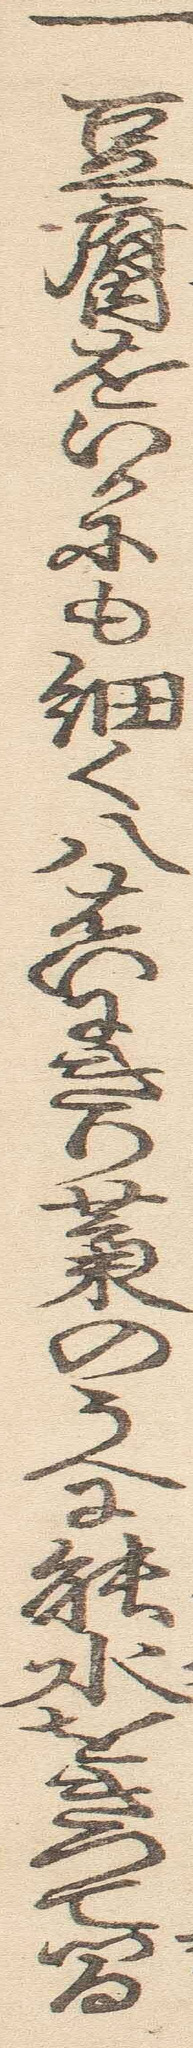一豆腐をいかにも細く八はいにきり藁のうへに能水をきつて間

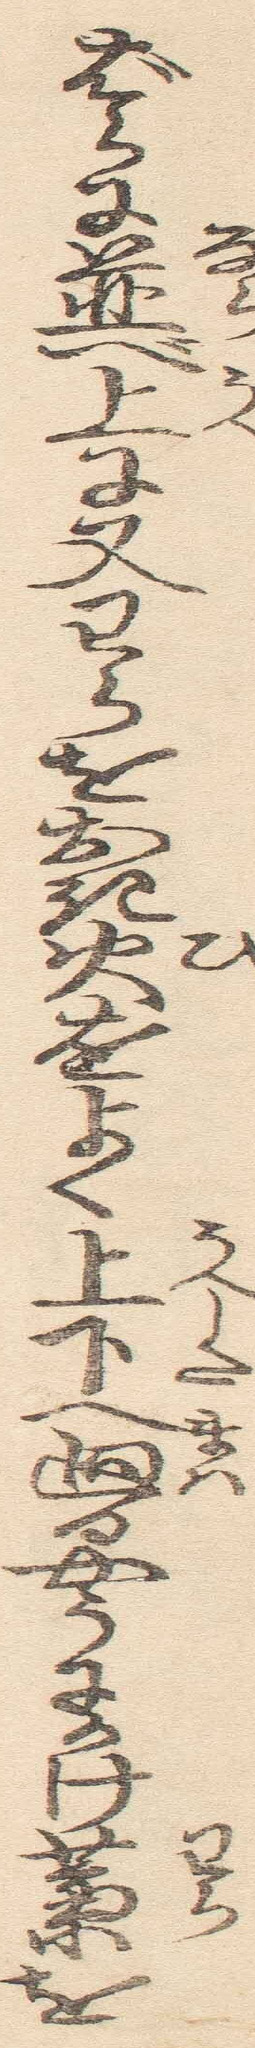ばらに並べ上に又わらをおき火をよく上下へ廻るやうにかけ藁を
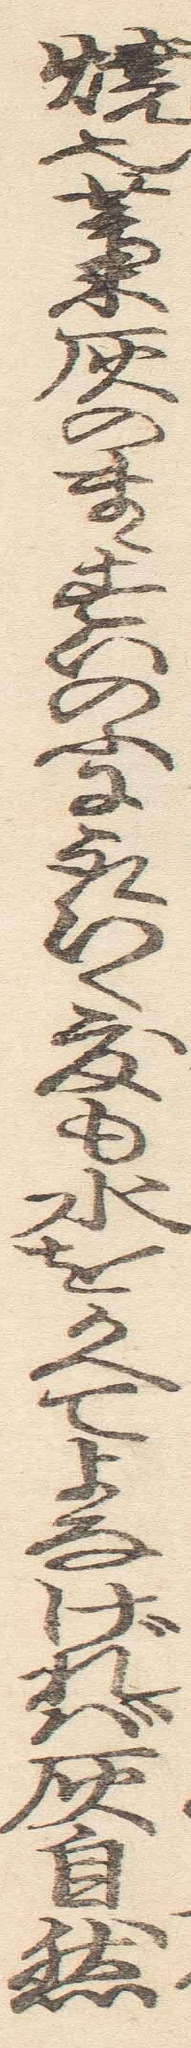焼也藁灰のまゝすいのふに取いく度も水をかへてよなげれば灰自然
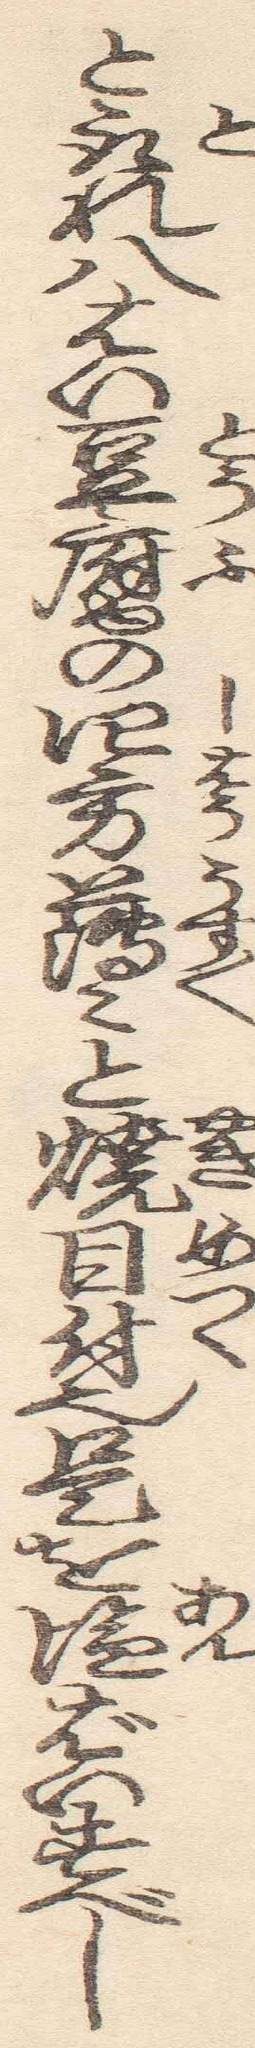と取れ八はい豆腐の四方薄々と焼目付也是を塩ばいすべし
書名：料理通
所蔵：東京学芸大学附属図書館 国文学研究資料館
